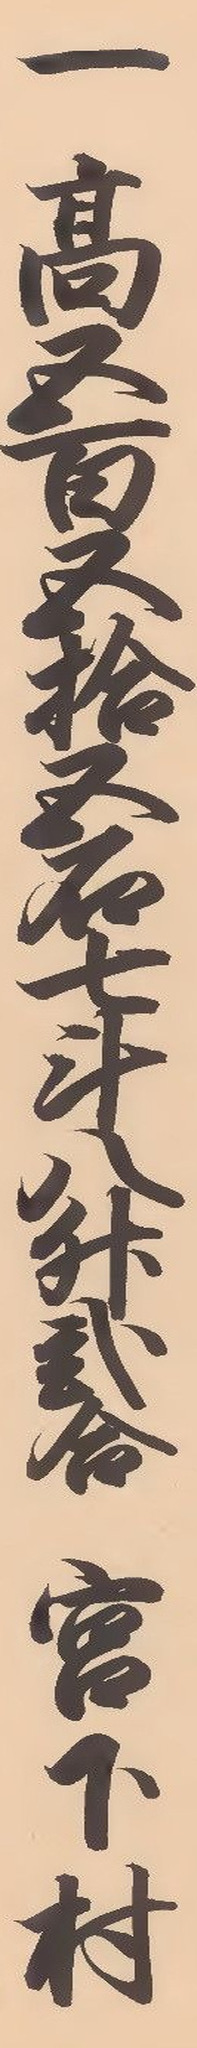一高五百五拾五石七斗八升弐合宮下村
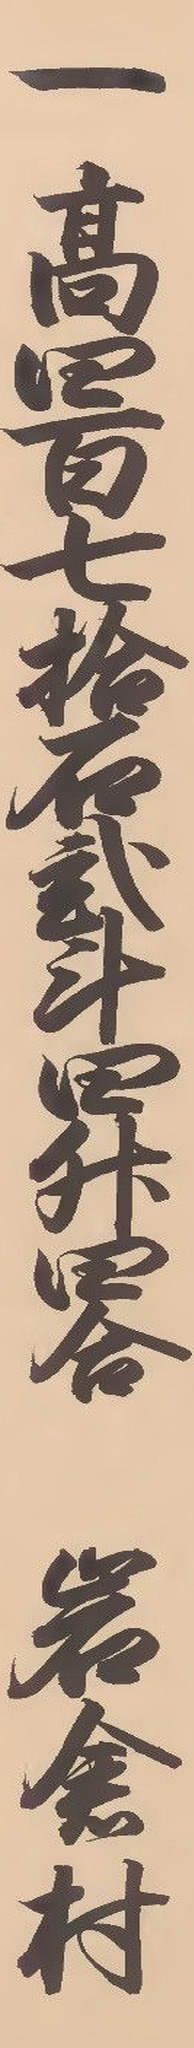一高四百七拾石弐斗四升四合岩倉村
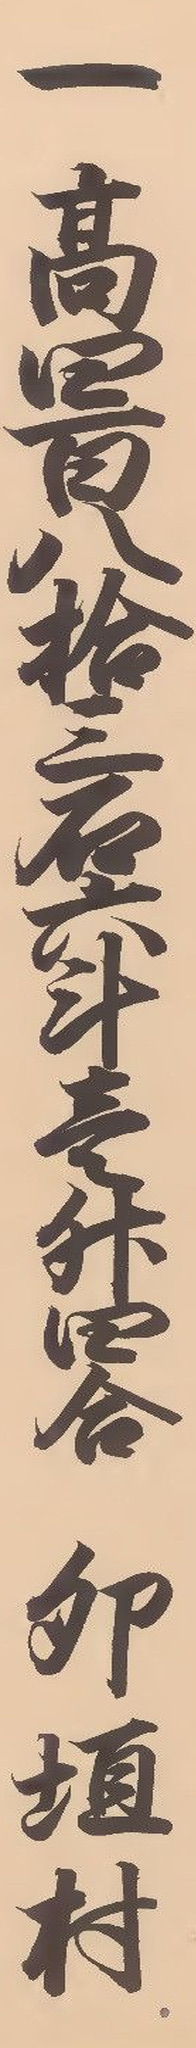一高四百八拾三石六斗壱升四合卯垣村
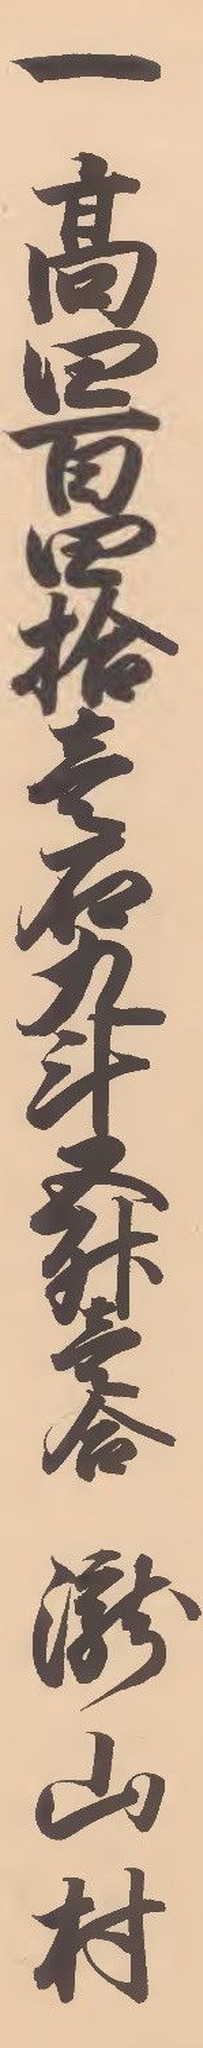一高四百四拾壱石九斗五升壱合滝山村

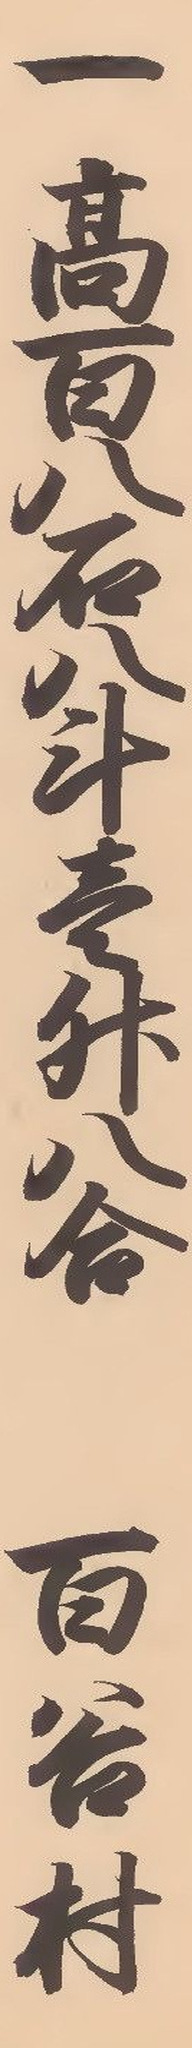一高百八石八斗壱升八合百谷村
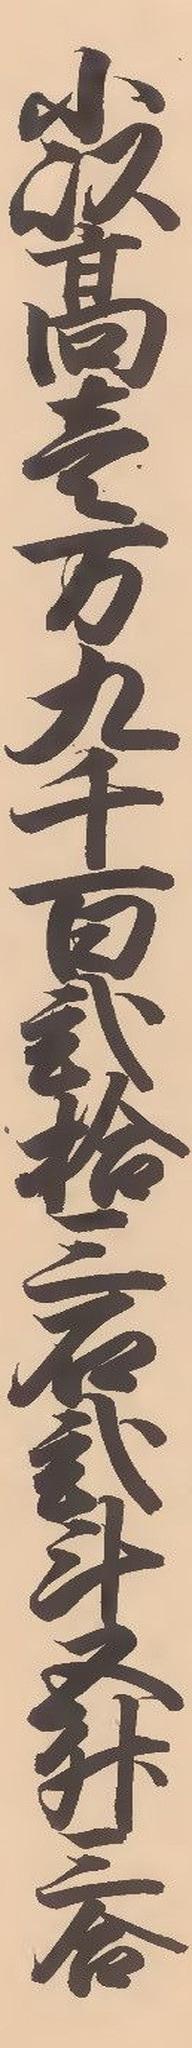小以高壱万九千百弐拾三石弐斗五升三合
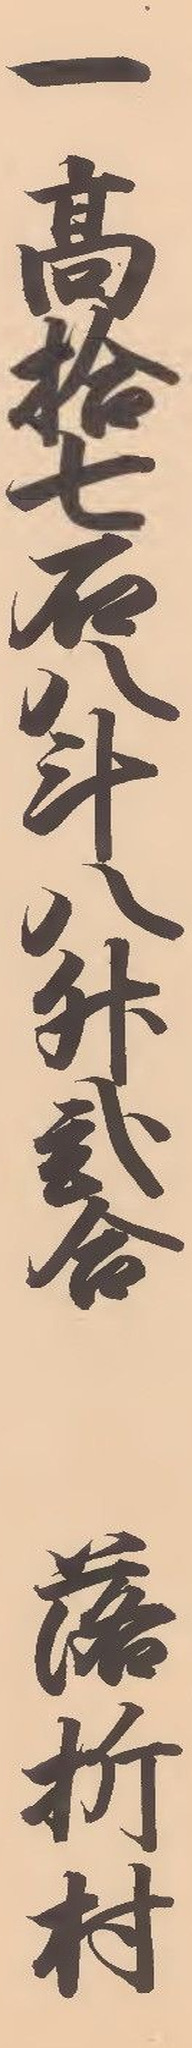一高拾七石八斗八升弐合落折村
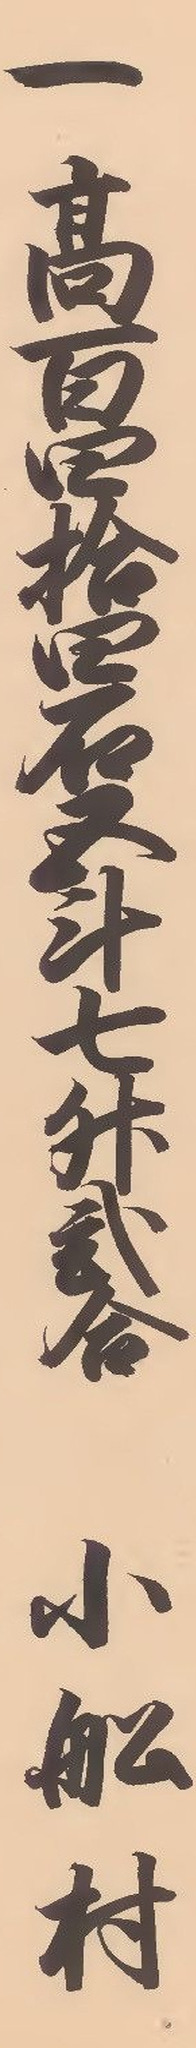一高百四拾四石五斗七升弐合小船村
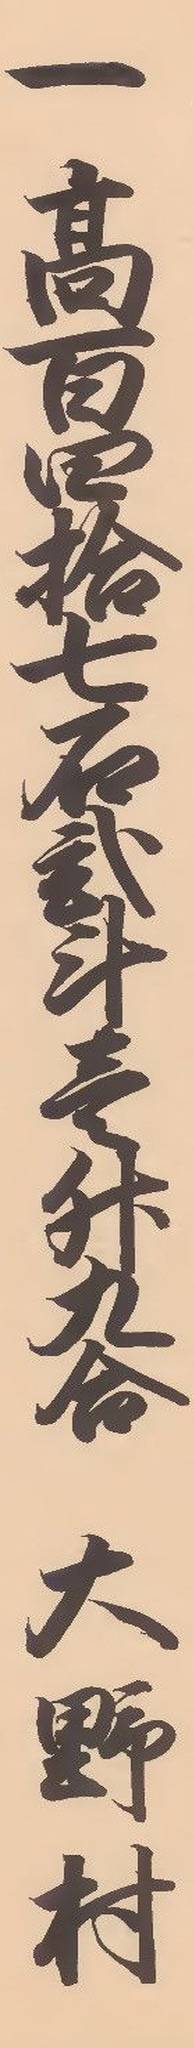一高百四拾七石弐斗壱升九合大野村

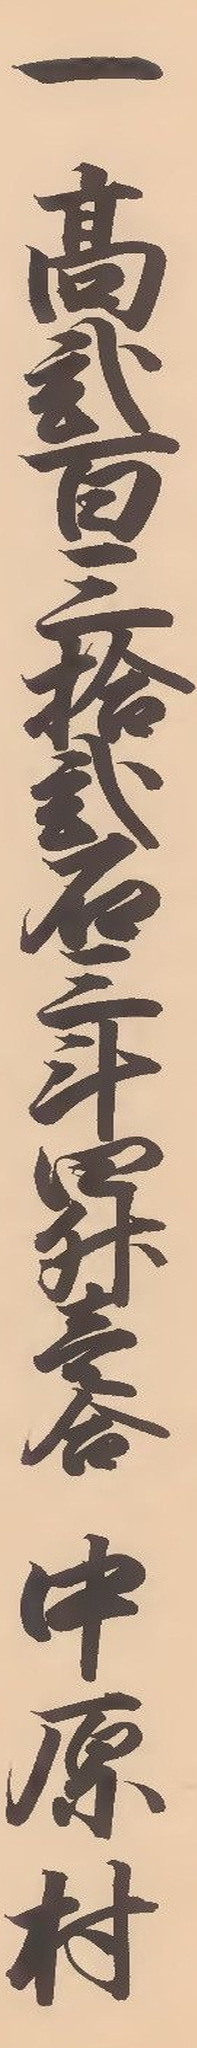一高弐百三拾弐石三斗四升壱合中原村
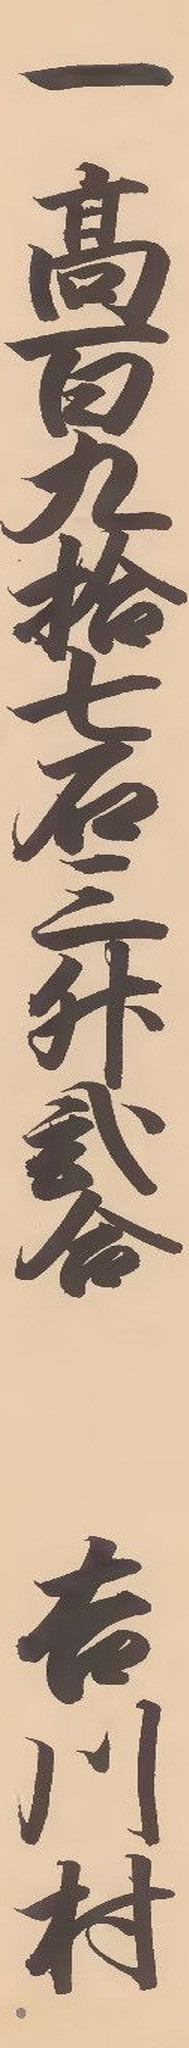一高百九拾七石三升弐合吉川村
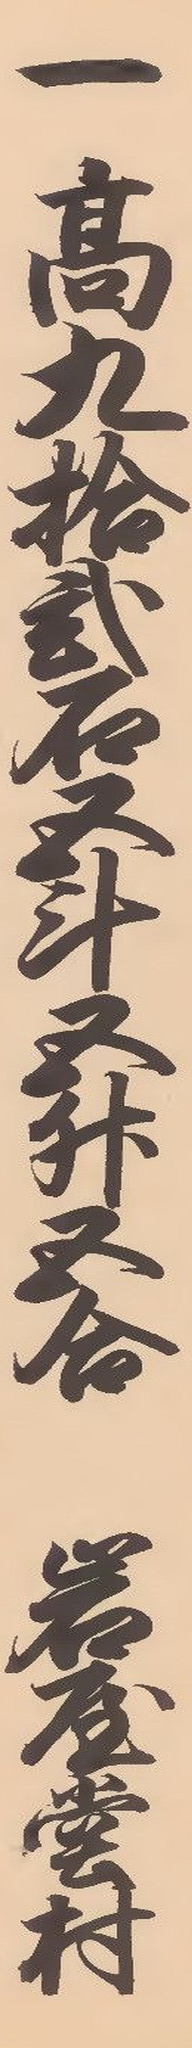一高九拾弐石五斗五升五合岩屋堂村
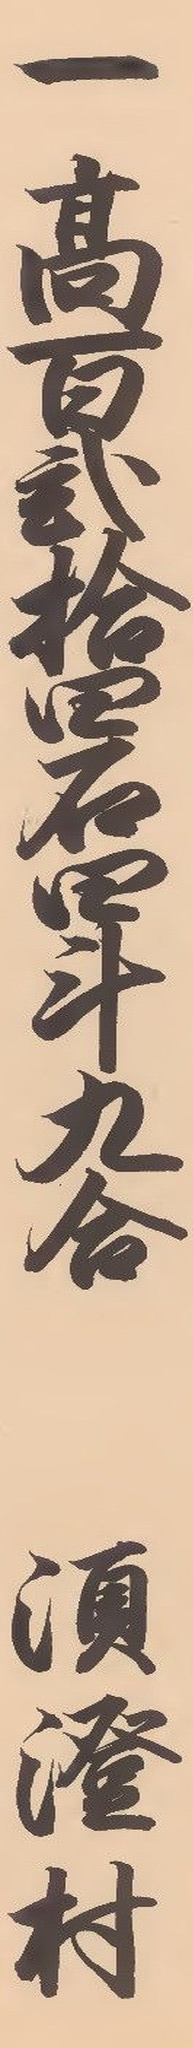一高百弐拾四石四斗九合須澄村
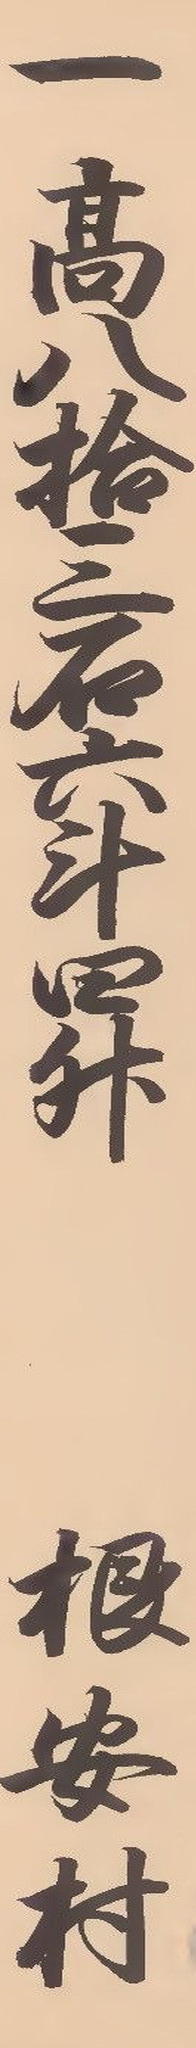一高八拾三石六斗四升根安村
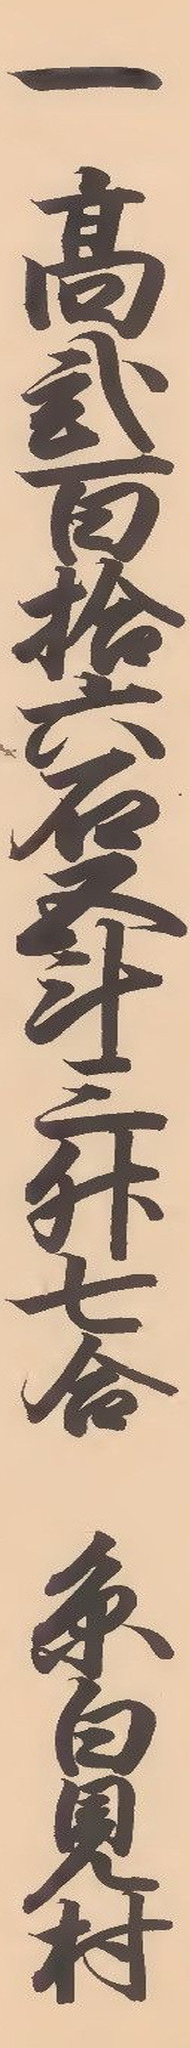一高弐百拾六石五斗三升七合糸白見村
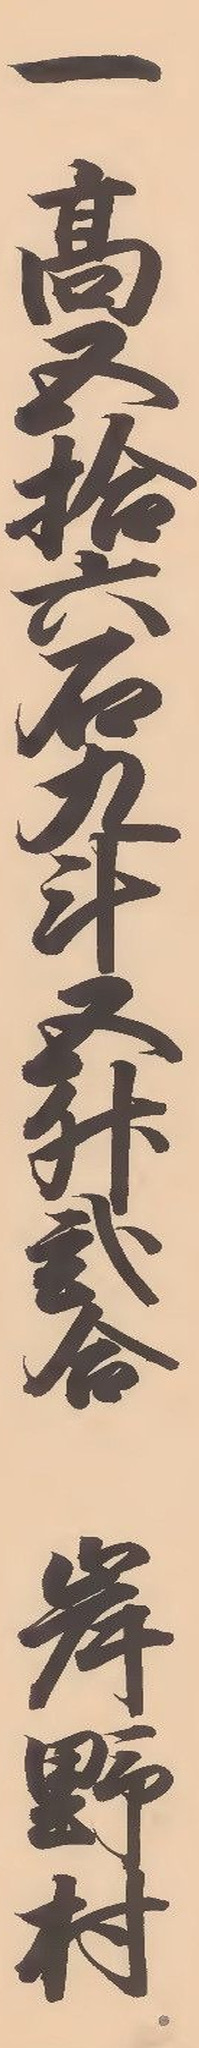一高五拾六石九斗五升弐合岸野村
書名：因幡国郷帳
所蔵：国立公文書館 National Archives of Japan
